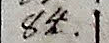84.
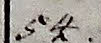54
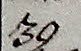39
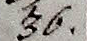36
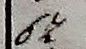62
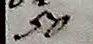50
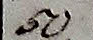50
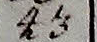43
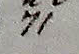71
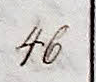46
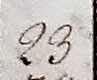23
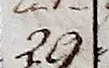29
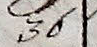36
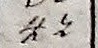42
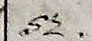52
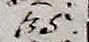35
